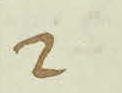2
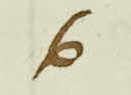6
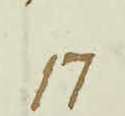17
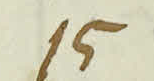15
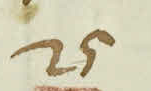25
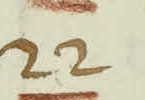22
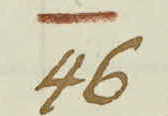46
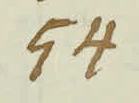54
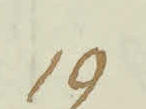19
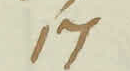17
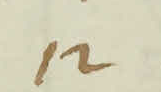12
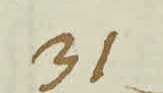31
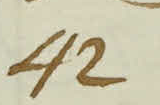42
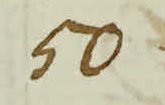50
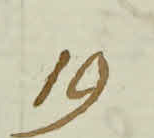19
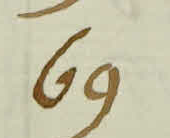69
